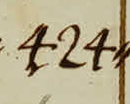424
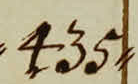435
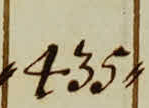435
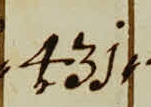431
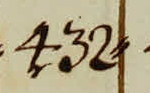432
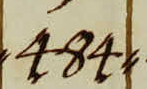484
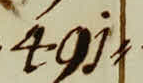491
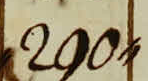290
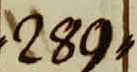289
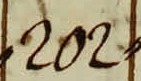202
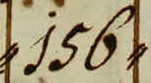156
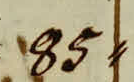85
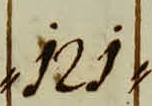121
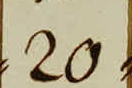20
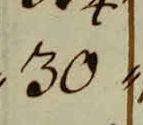30
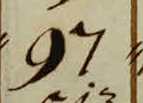97
